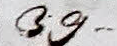39
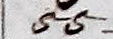55
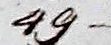49
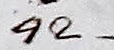42
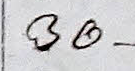30
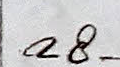28
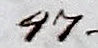47
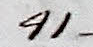41
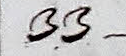33
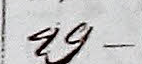49
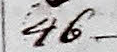46
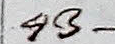43
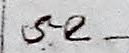52
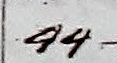44
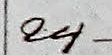24
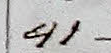41
